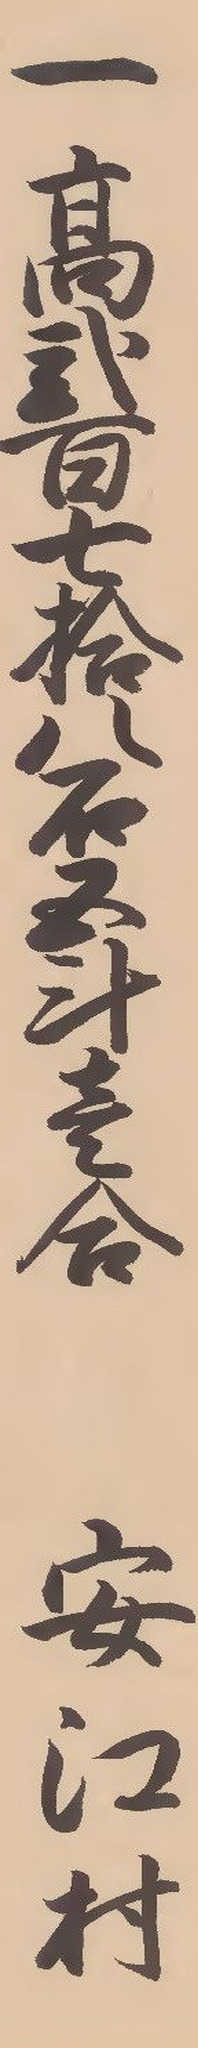一高弐百七拾八石五斗壱合安江村
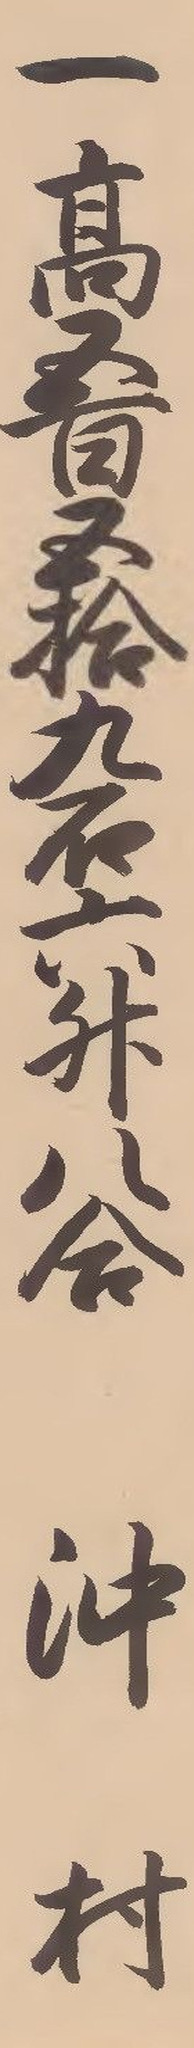一高五百五拾九石六升八合沖村
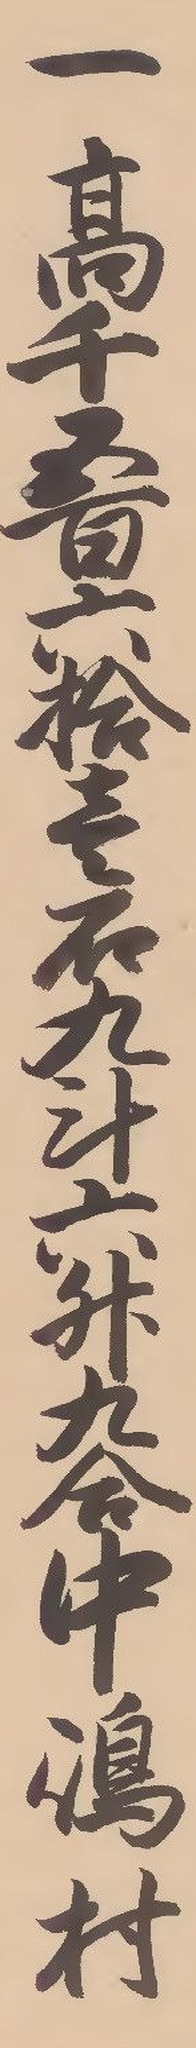一高千五百六拾壱石九斗六升九合中島村

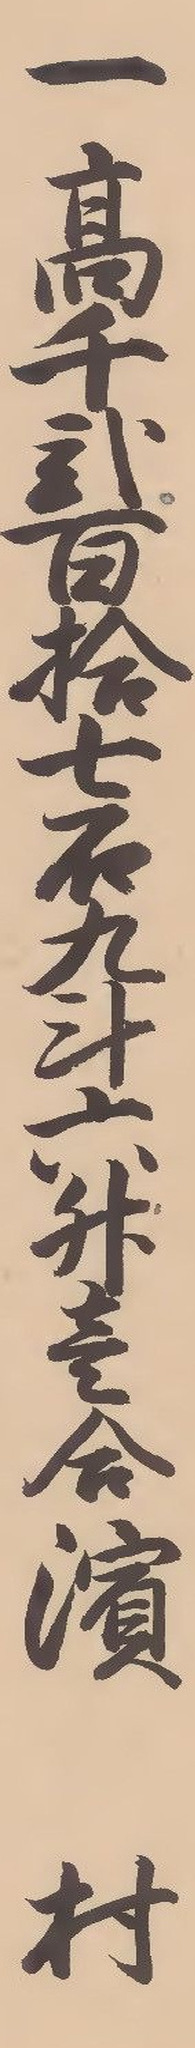一高千弐百拾七石九斗六升壱合浜村
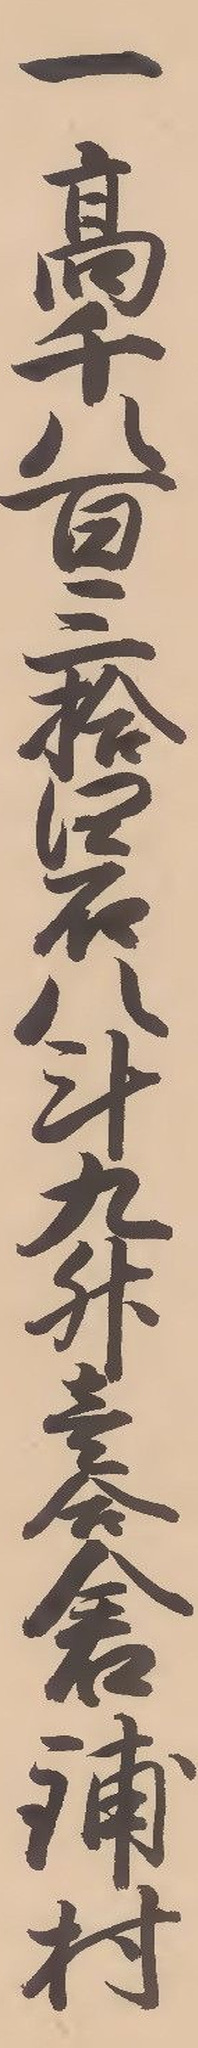一高千八百三拾四石八斗九升壱合倉鋪村
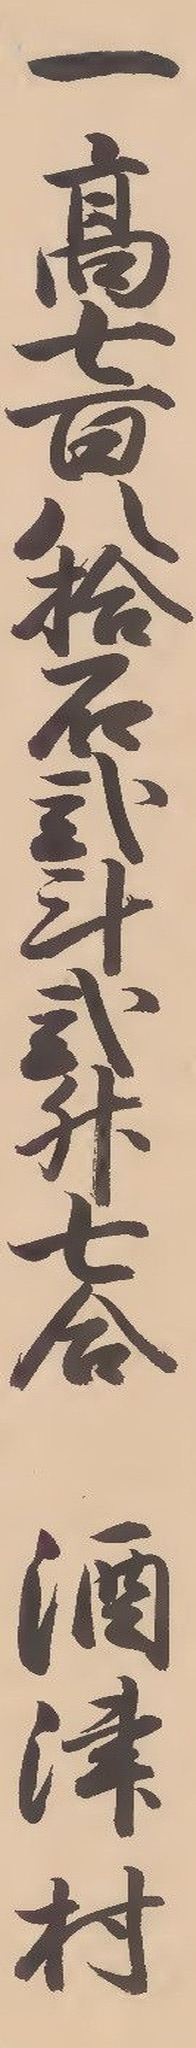一高七百八拾石弐斗弐升七合酒津村
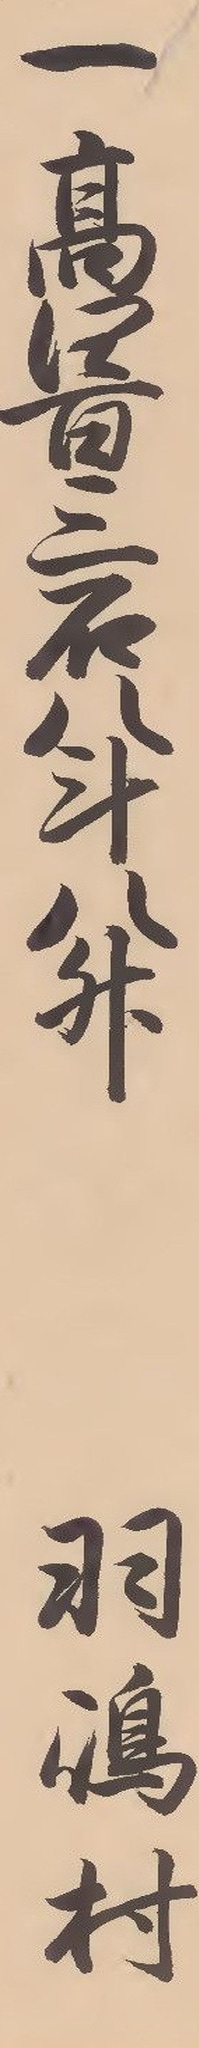一高四百三石八斗八升羽島村
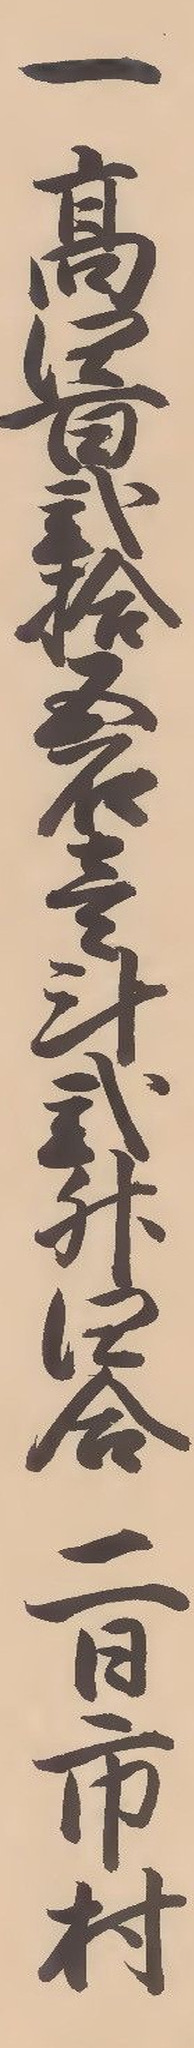一高四百弐拾五石壱斗弐升四合二日市村
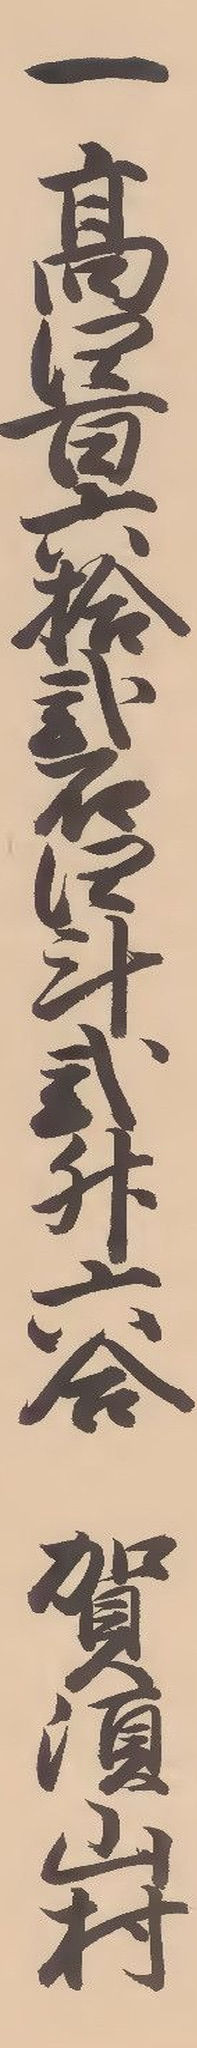一高四百六拾弐石四斗弐升六合賀須山村
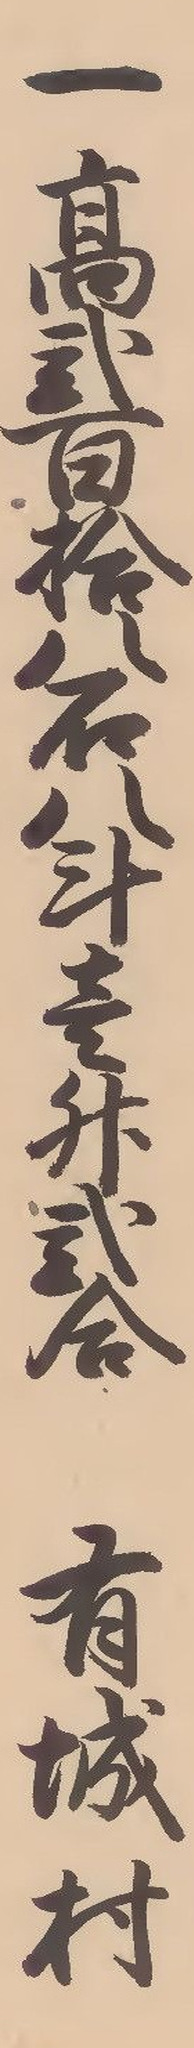一高弐百拾八石八斗壱升弐合有城村

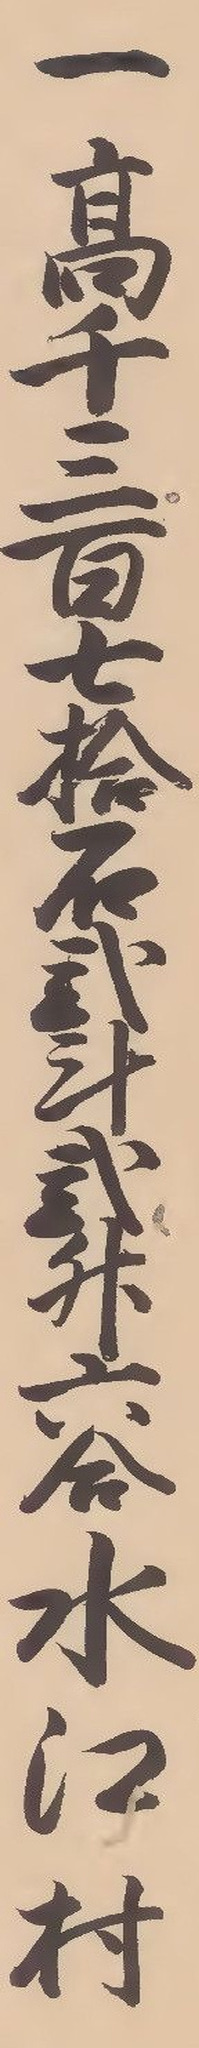一高千三百七拾石弐斗弐升六合水江村
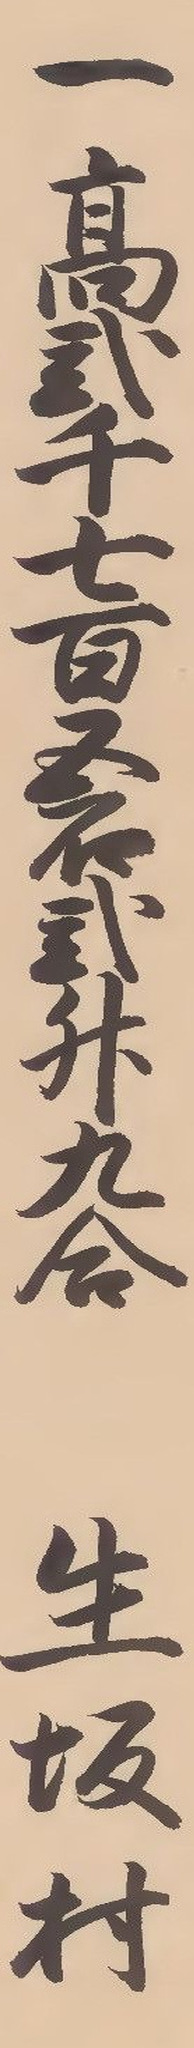一高弐千七百五石弐升九合生坂村
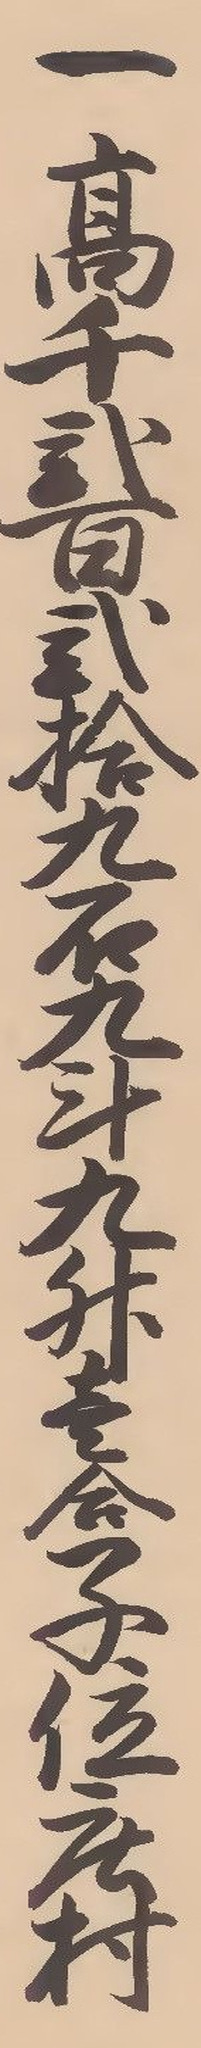一高千弐百弐拾九石九斗九升壱合子位庄村
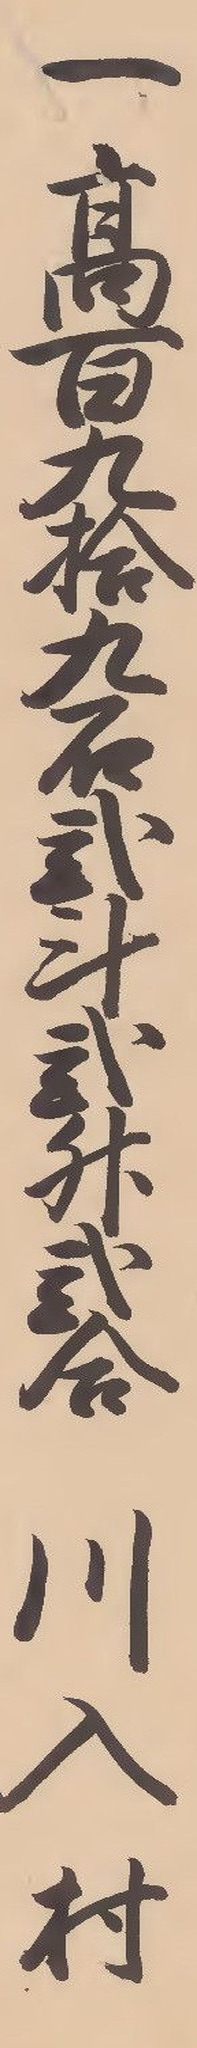一高百九拾九石弐斗弐升弐合川入村
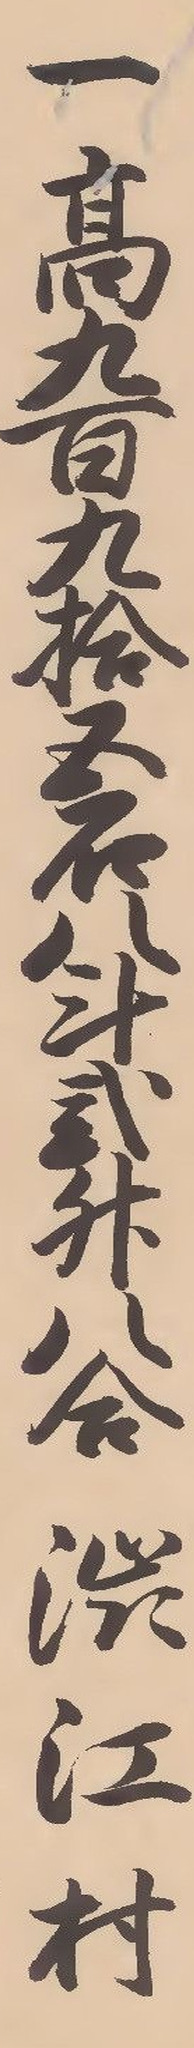一高九百九拾五石八斗弐升八合渋江村
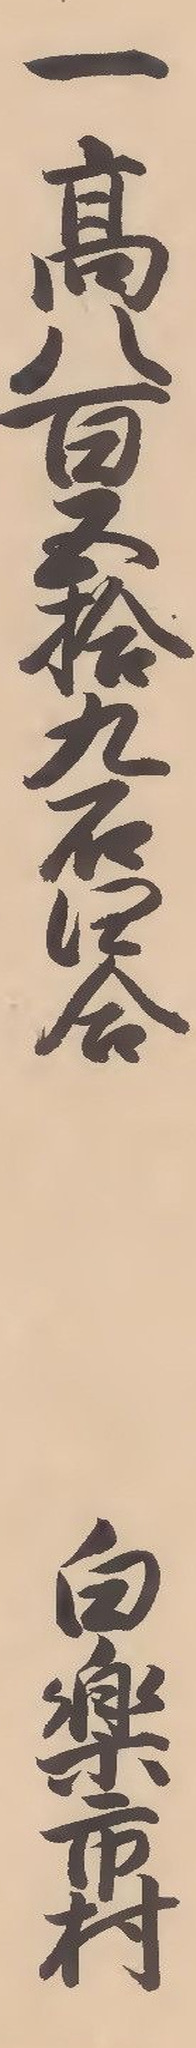一高八百五拾九石四合白楽市村
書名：備中国郷帳
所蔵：国立公文書館 National Archives of Japan
